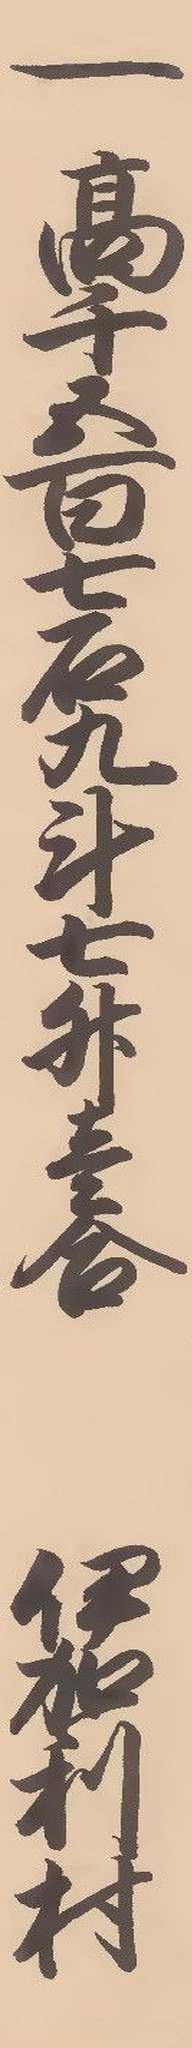一髙千五百七石九斗七升壱合伊加利村
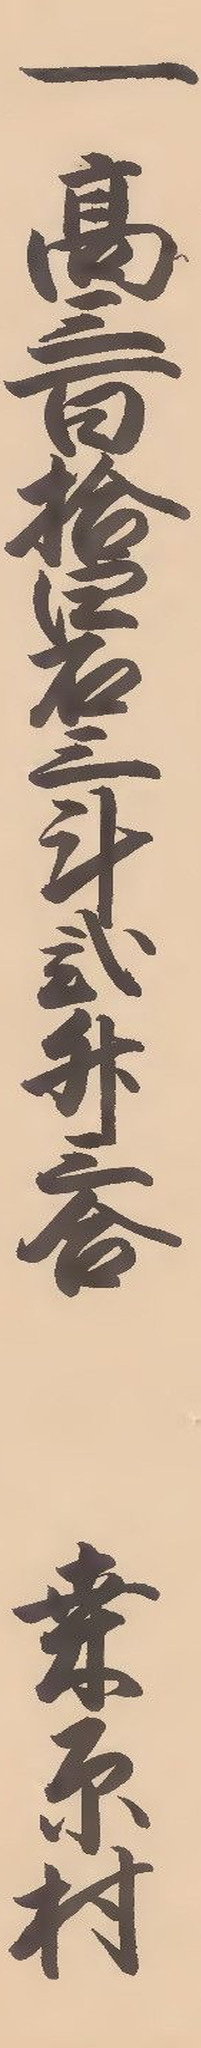一髙三百拾四石三斗弐升三合桑原村
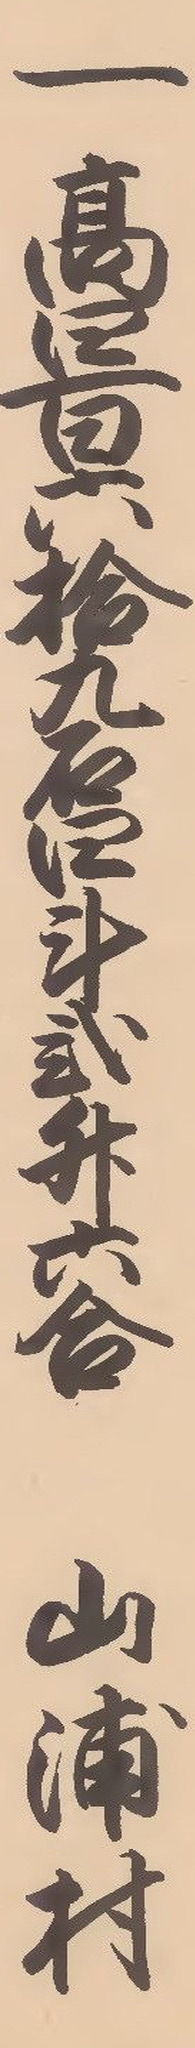一髙四百六拾九石四斗弐升六合山浦村
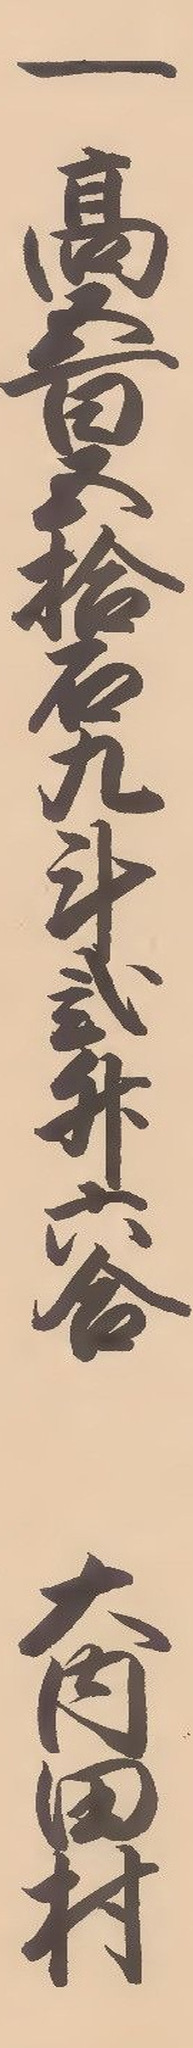一髙五百五拾石九斗弐升六合大内田村

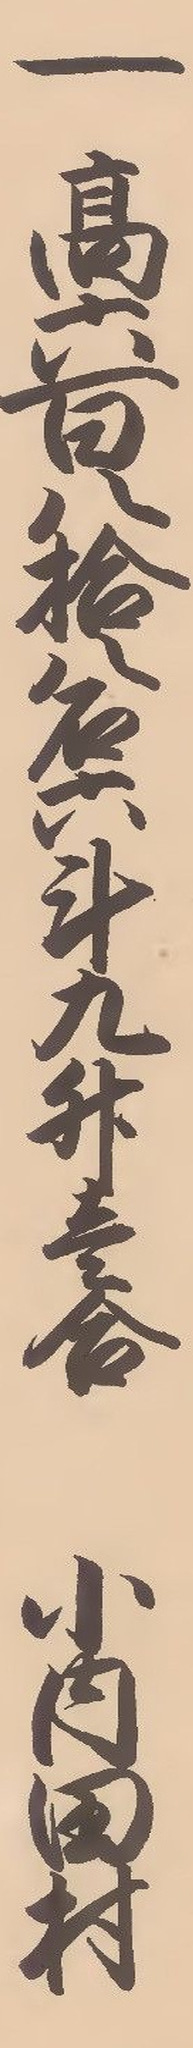一髙六百八拾八石六斗九升壱合小内田村
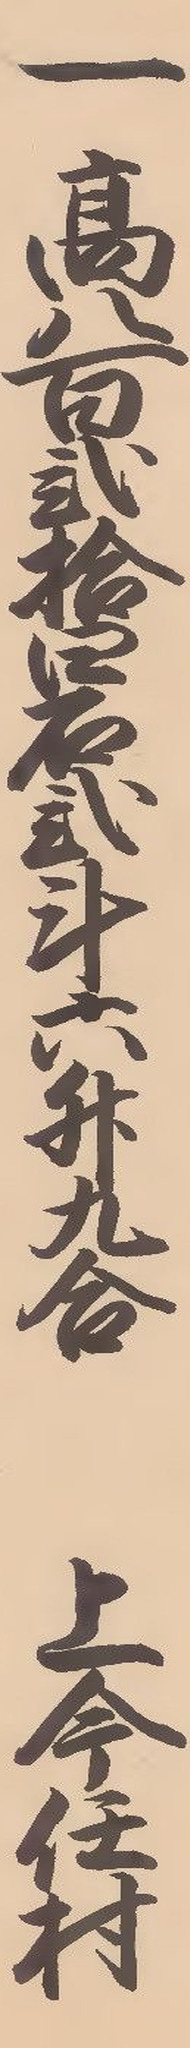一髙八百弐拾四石弐斗六升九合上今任村
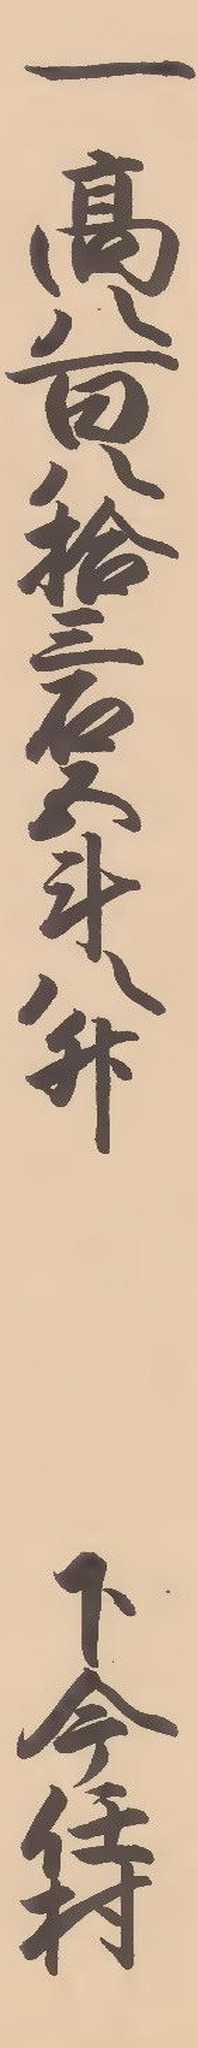一髙八百八拾三石五斗八升下今任村
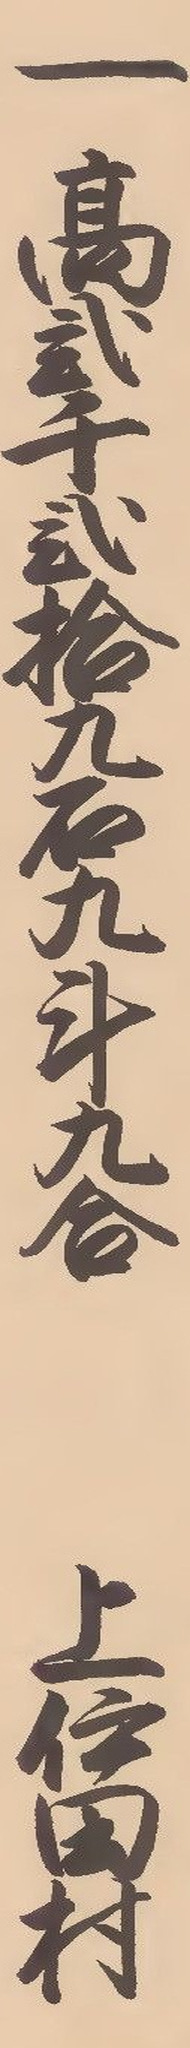一髙弐千弐拾九石九斗九合上伊田村
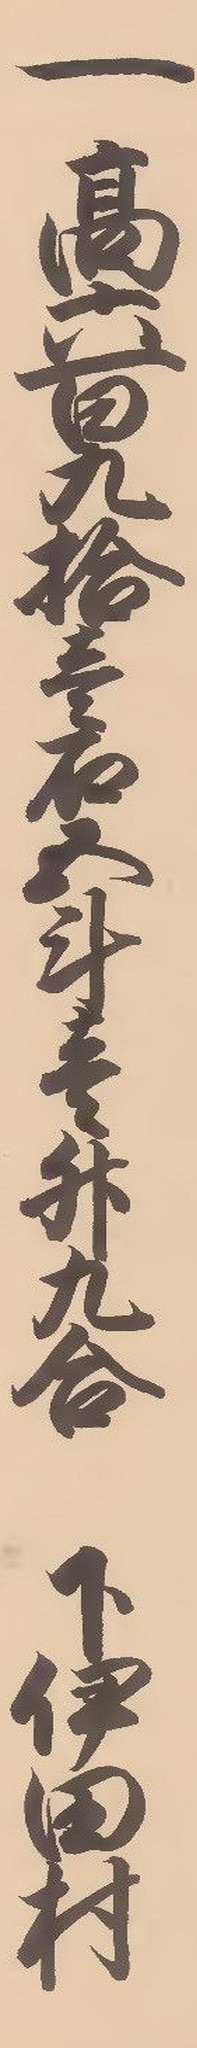一髙六百九拾壱石五斗壱升九合下伊田村
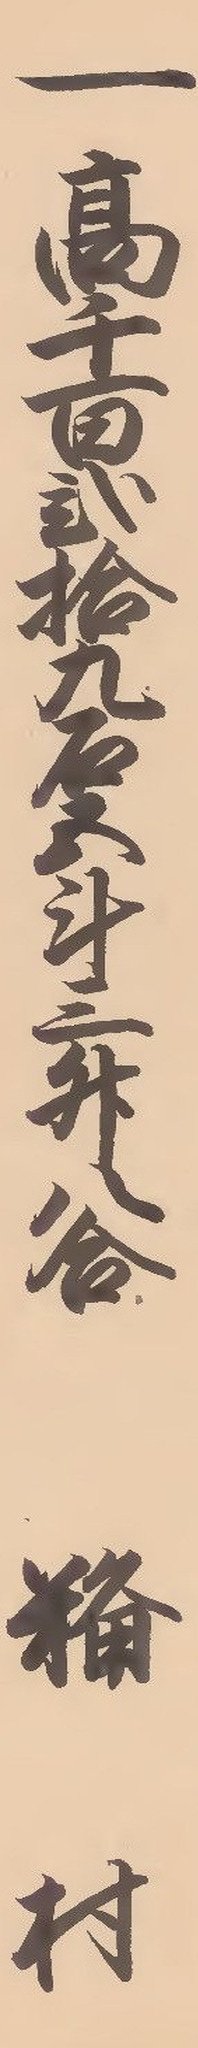一髙千百弐拾九石五斗三升八合糒村
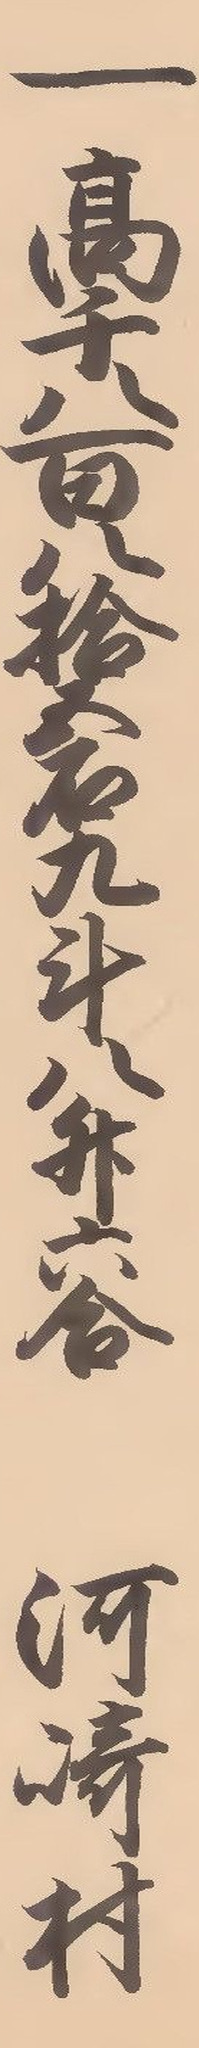一髙千八百八拾五石九斗八升六合河崎村
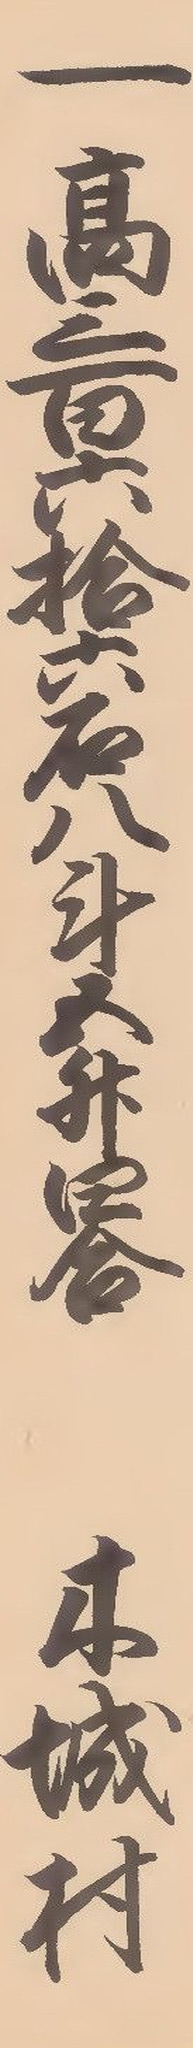一髙三百六拾六石八斗五升四合木城村

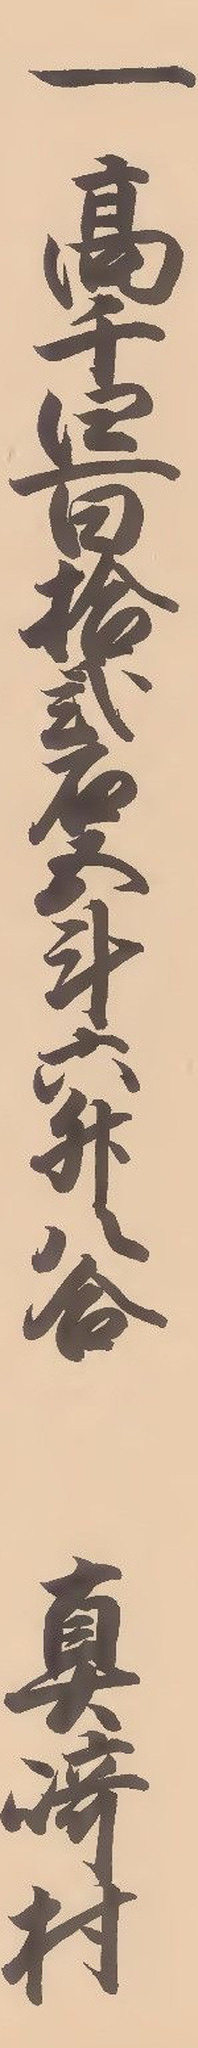一髙千四百拾弐石五斗六升八合真崎村
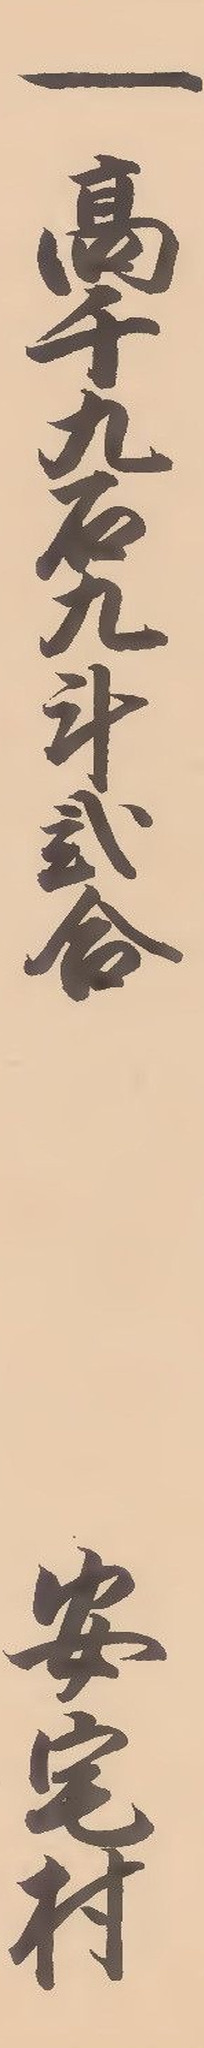一髙千九石九斗弐合安宅村
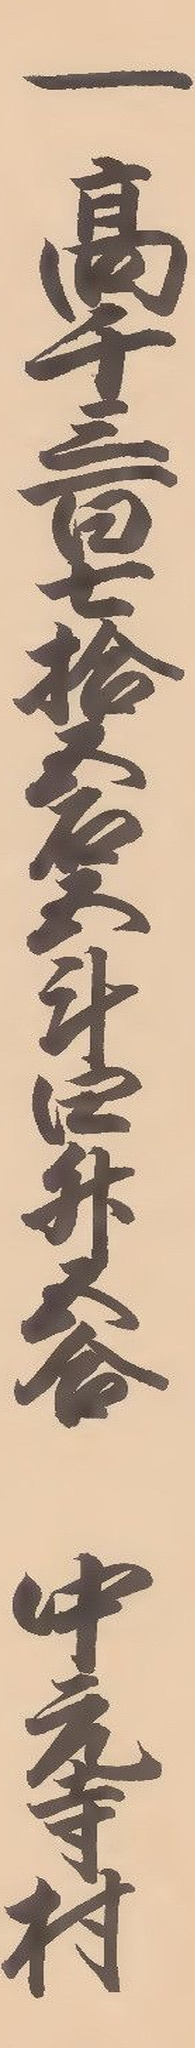一髙千三百七拾五石五斗四升五合中元寺村
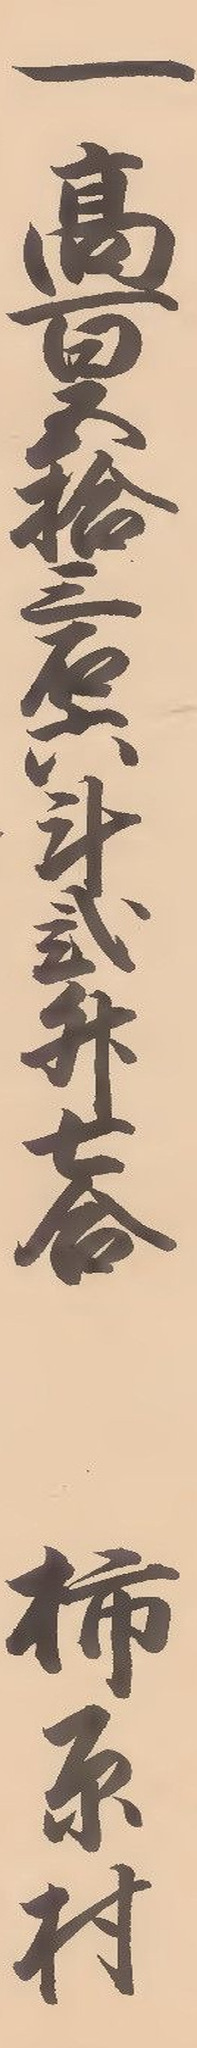一高百五拾三石六斗弐升七合柿原村
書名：豊前国郷帳
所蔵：国立公文書館 National Archives of Japan
